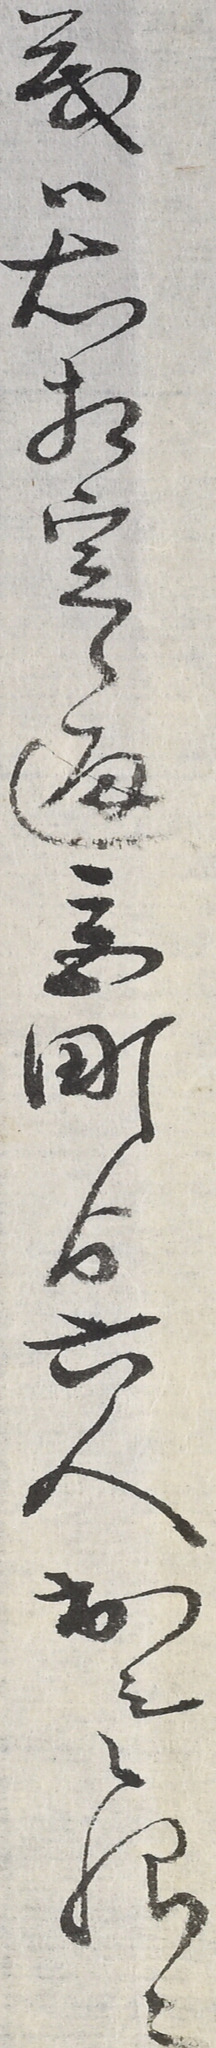義ハ右相定候通宮町ゟ六人出シ候様ニ
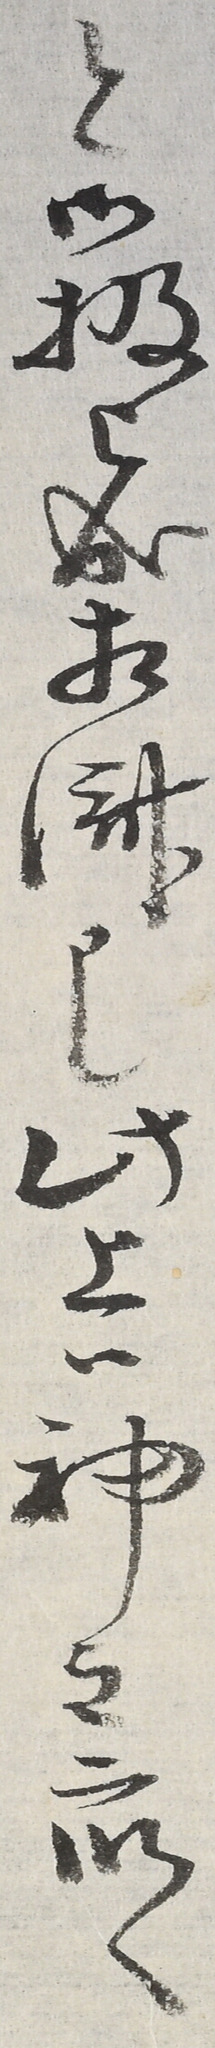と御扱被成相済申候此上ハ神主衆へ
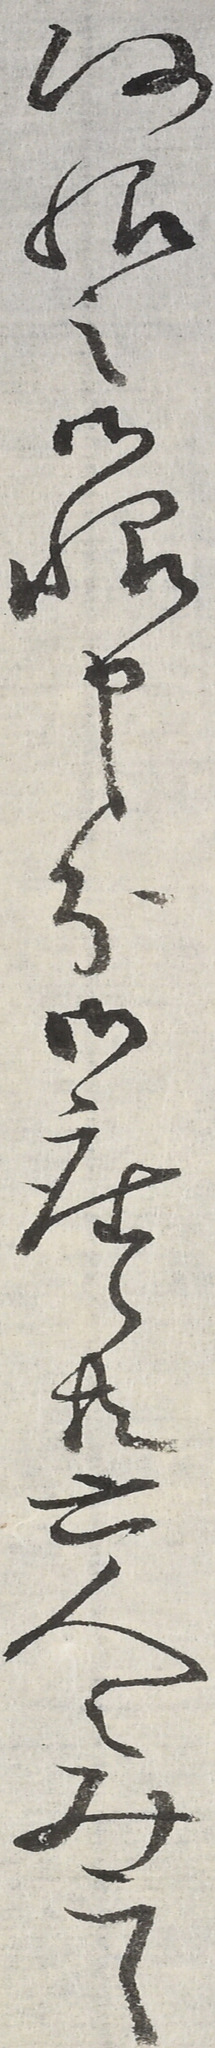何様之御恨申分御座候共六人之みこし
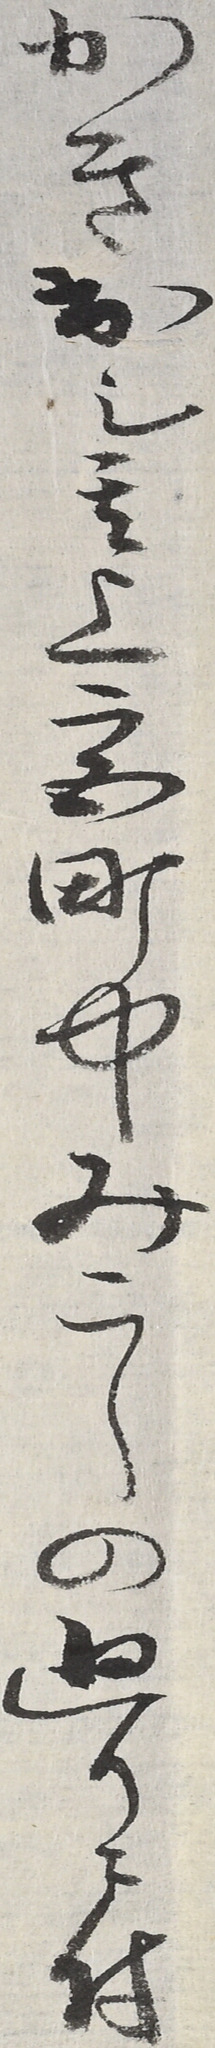かき出シ其上宮町中みこしの廻りニ付
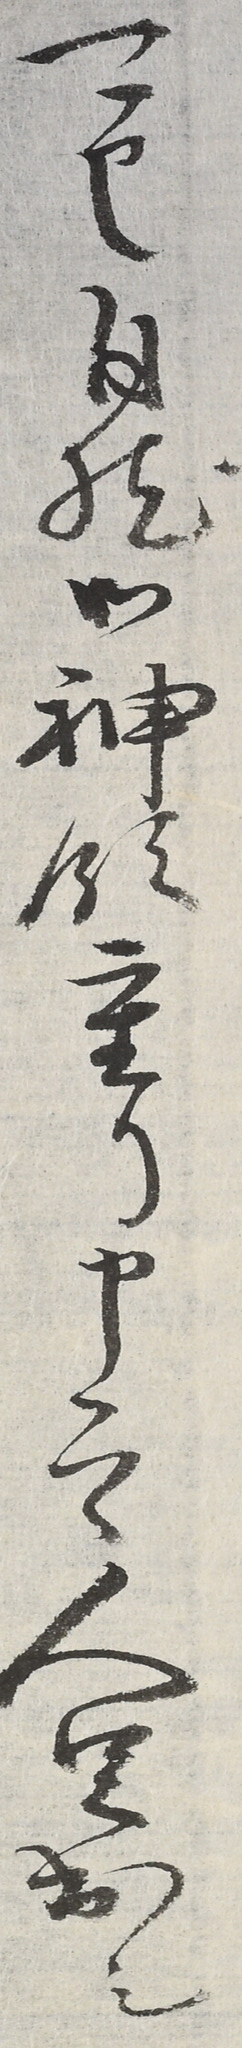可申候自然御神領重り申候ハヽ人足出シ
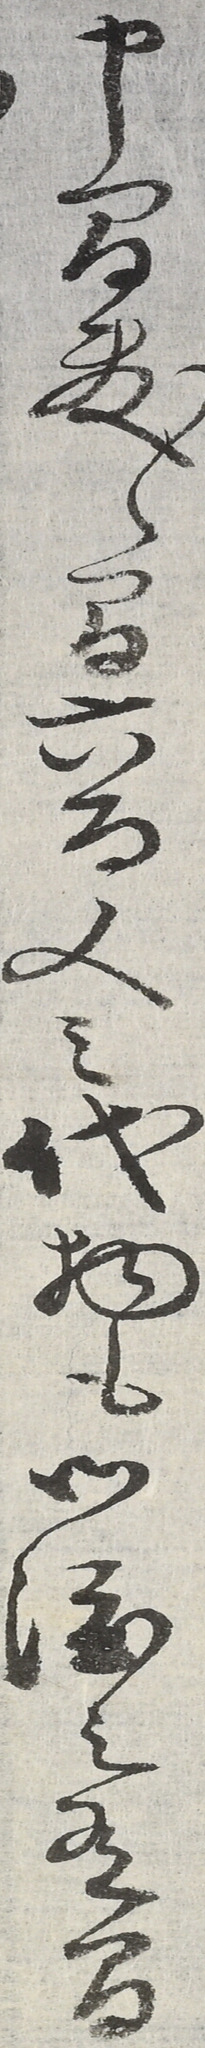申間敷候間六百文之代物も御渡シ有間
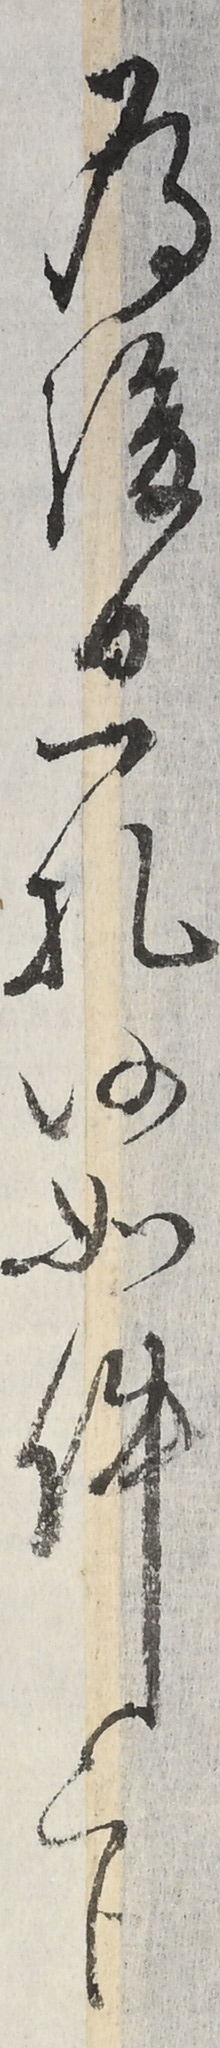為後日一札仍如件以上
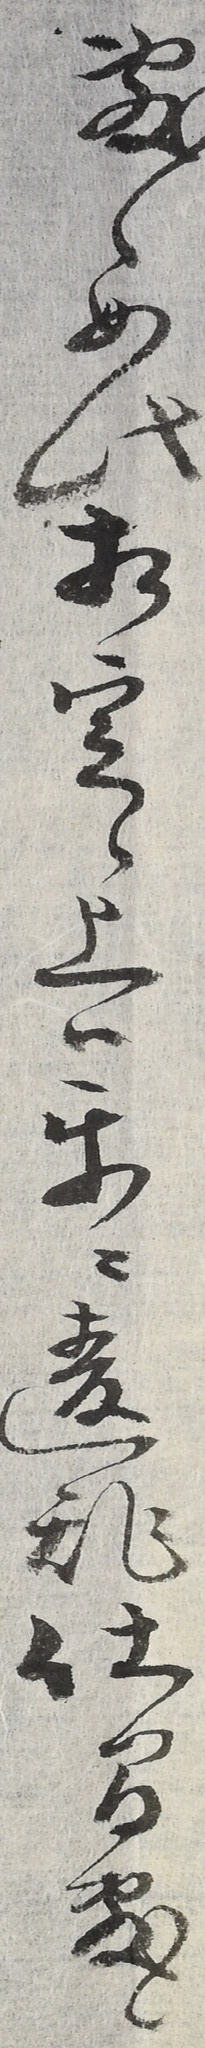敷候如此相定候上ハ互ニ違乱仕間敷候
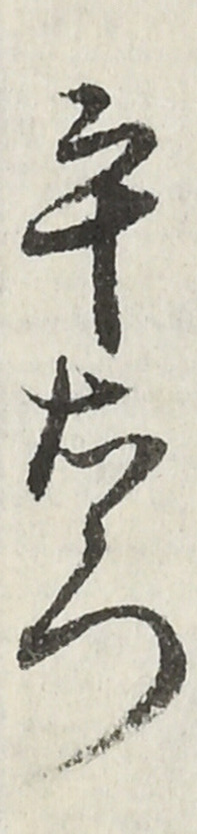源右衛門
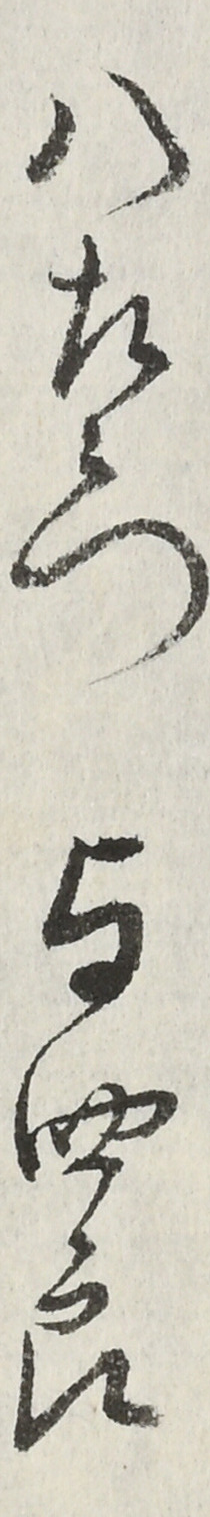八左衛門与四郎
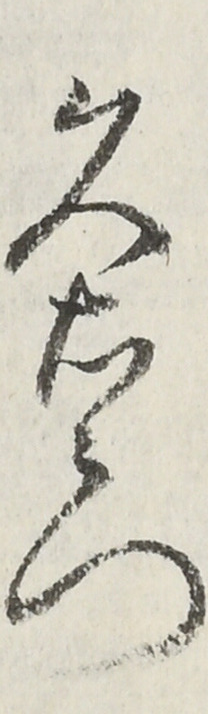源右衛門
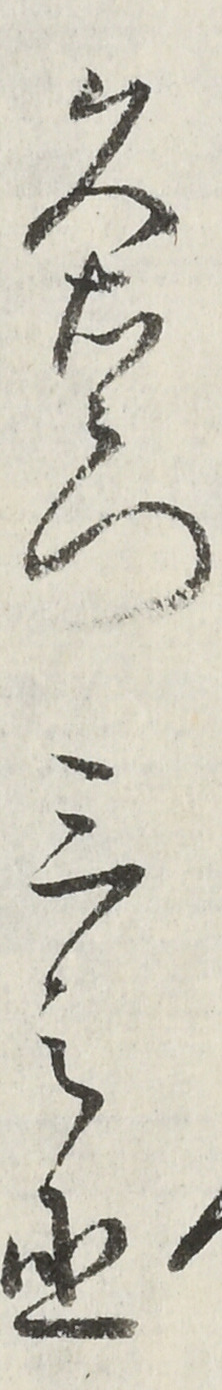久右衛門三之丞
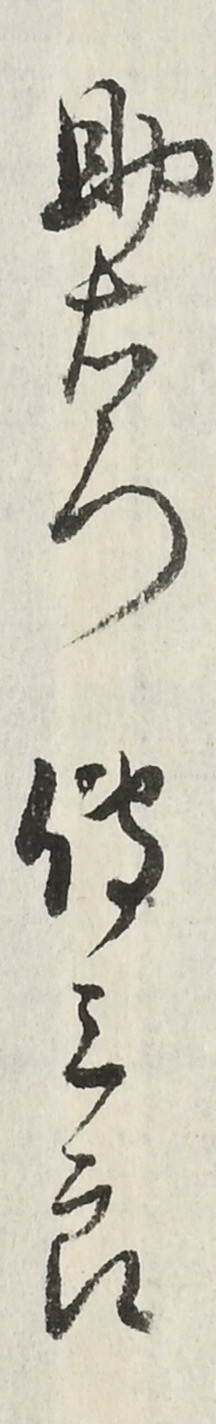助右衛門伝三郎
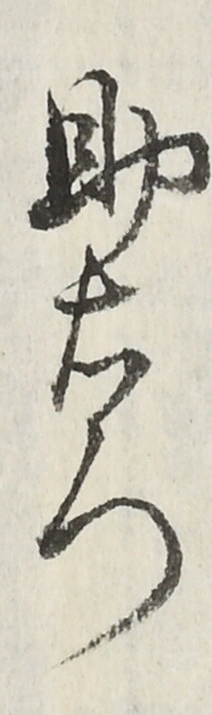源右衛門
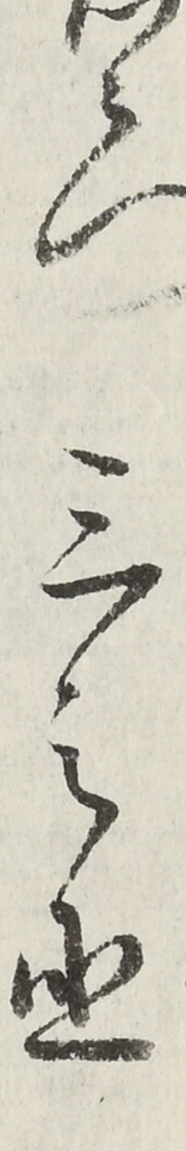久右衛門三之丞
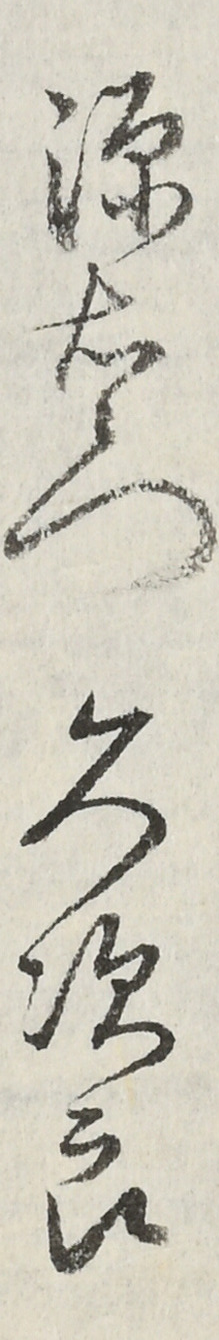源右衛門久次郎
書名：旧記
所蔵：伊那市立高遠町図書館・合同会社AMANE
